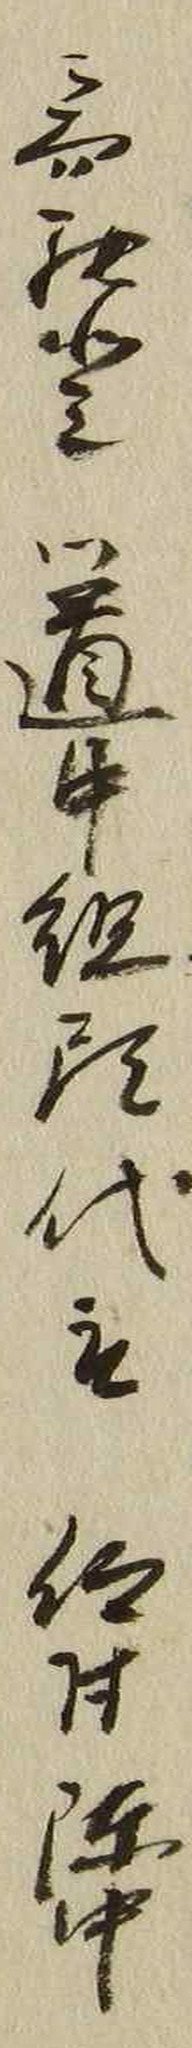ニ而罷登御道中組頭代被仰付陣中
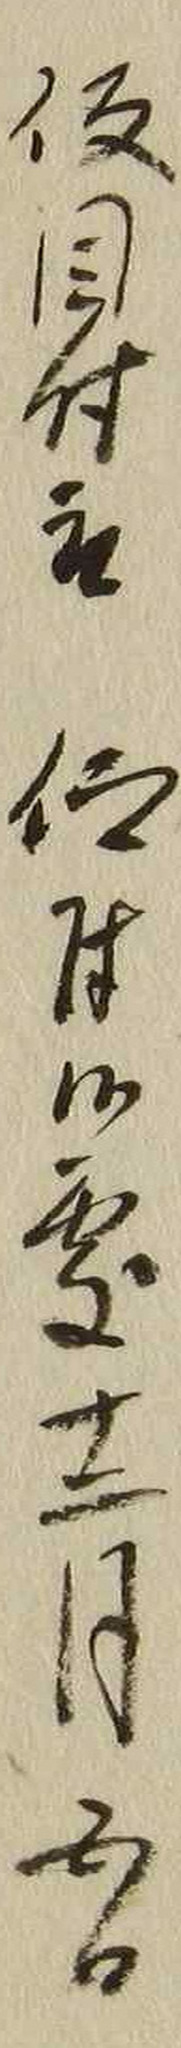仮目付被仰付候処十二月五日
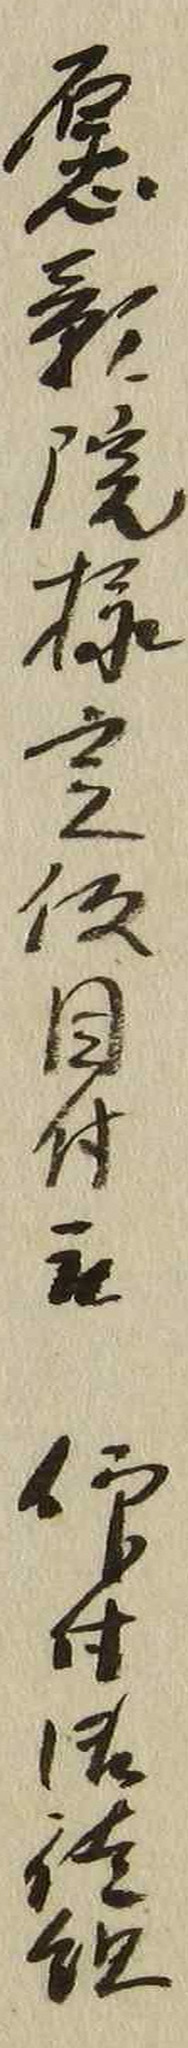愿彰院様定仮目付被仰付御徒組
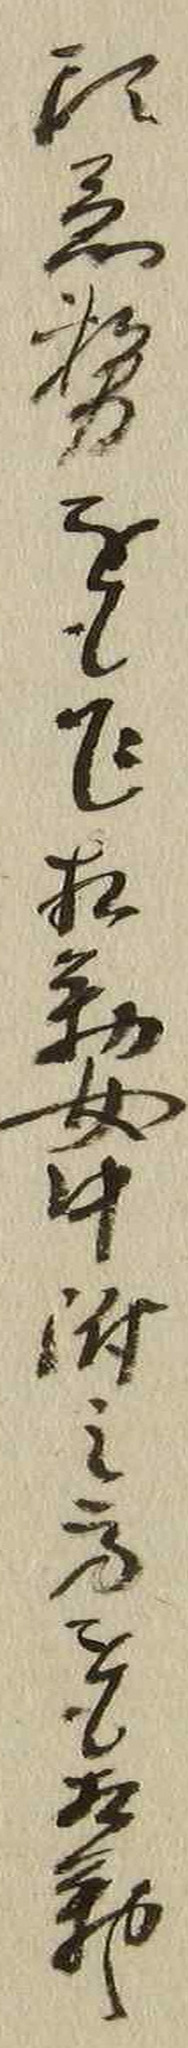頭兼務をも乍相勤女中附之方をも相勤候
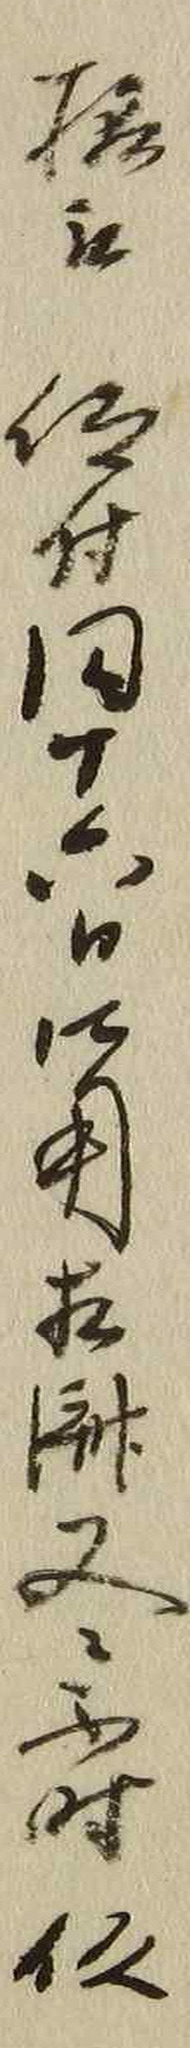様被仰付同十六日御用相済又々不時仮
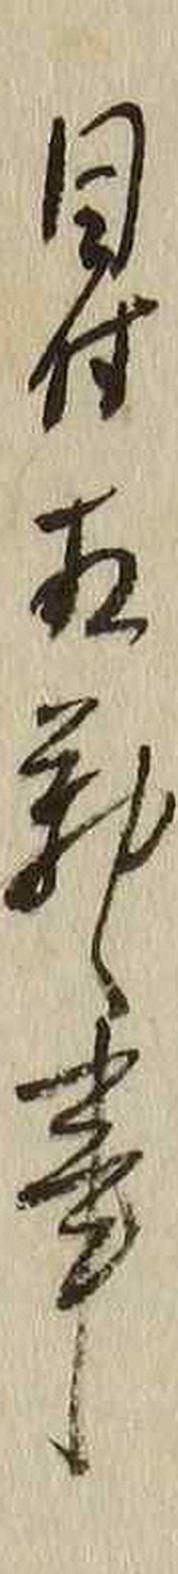目付相勤候事
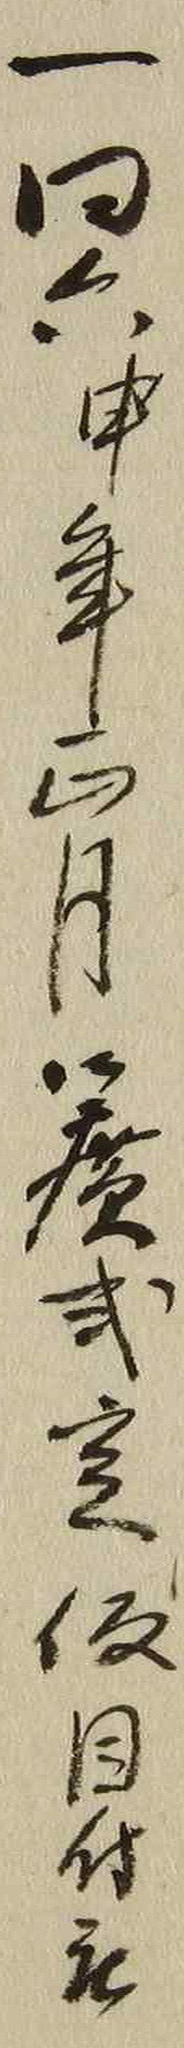一同六申年正月御広敷定仮目付被
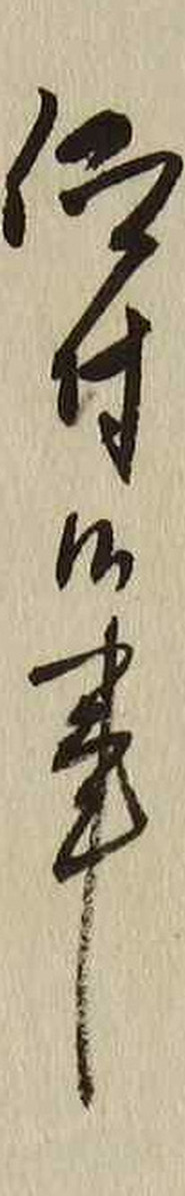仰付候事
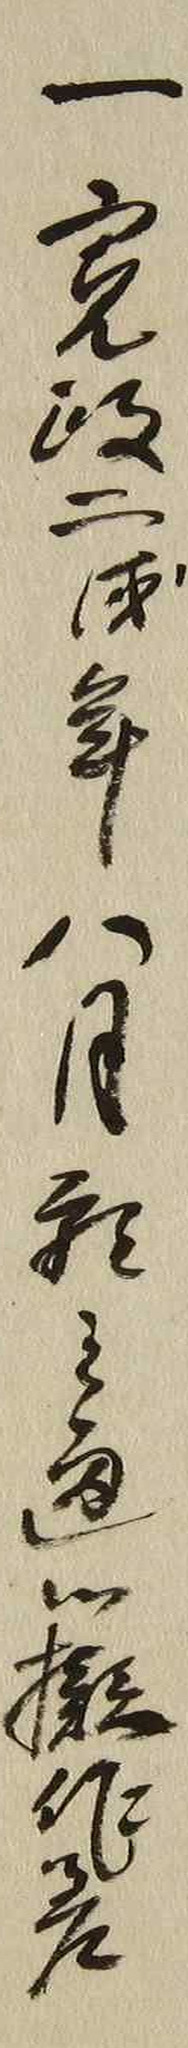一寛政二戊年八月願之通御擬作差
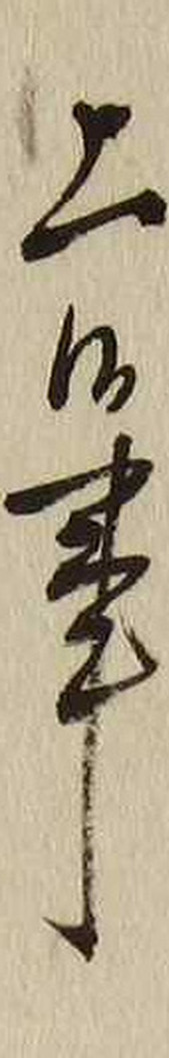上候事
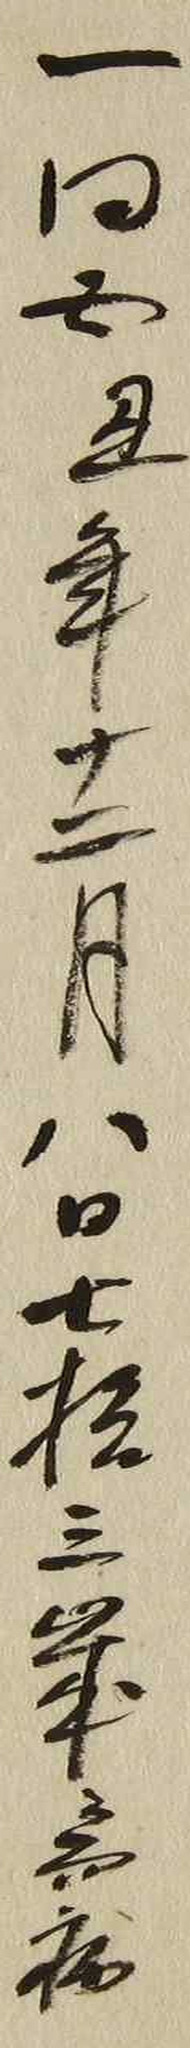一同五丑十二月八日七拾三歳ニ而病
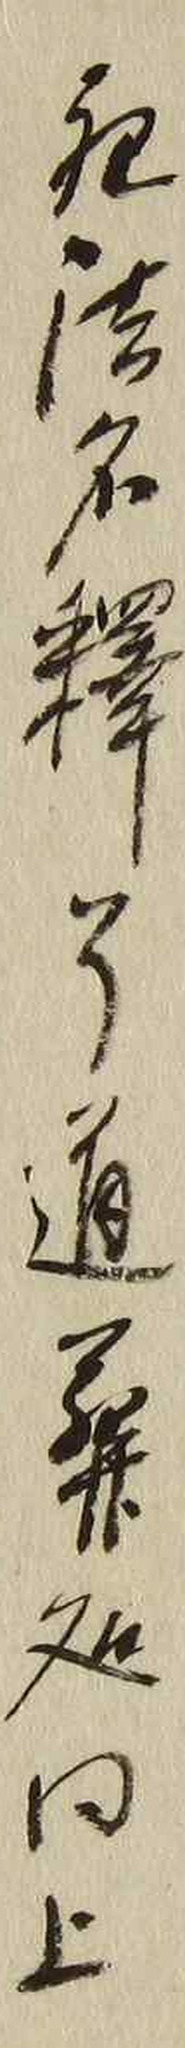死法名釈了道葬処同上
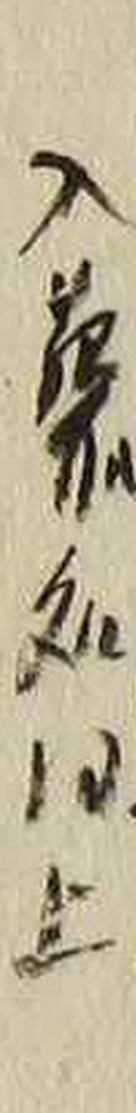入葬処同上
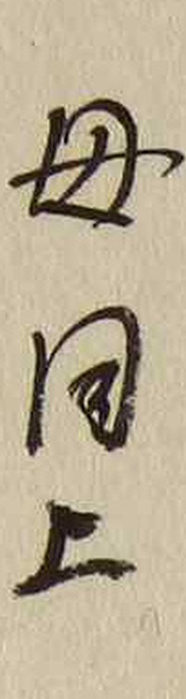母同上
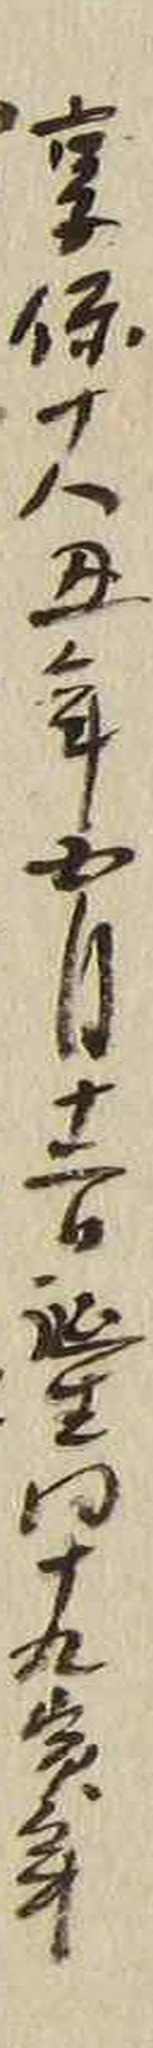享保十八丑年五月十二日誕生同十九寅年

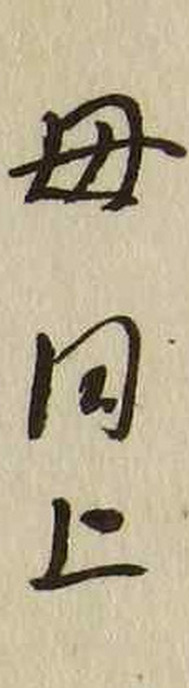母同上
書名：諸士系譜　巻之360　す之部10
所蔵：会津若松市立会津図書館
